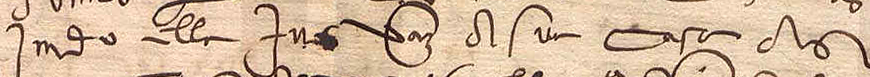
Jmdo ella Jnes Vāz A Sua Casa As
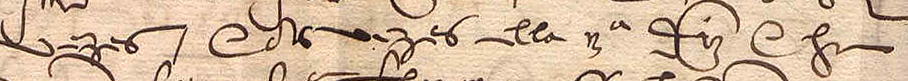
vezes / E As vezes ella ma dīz e ha
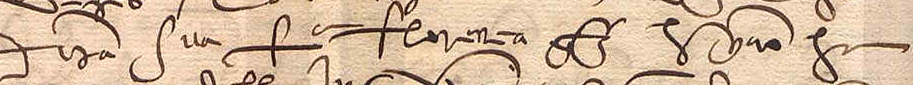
dit̄a sua fa florença gz̄ hyão ha
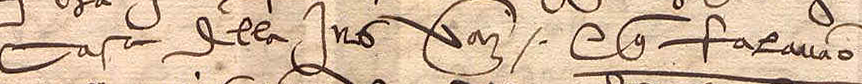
Casa della Jnes Vāz /. E q̄ falauaõ
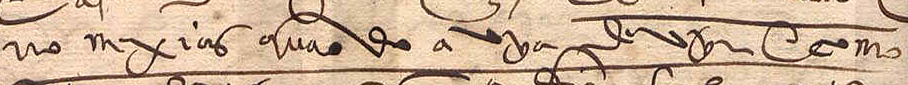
no mexias quãodo avya de vyr E como
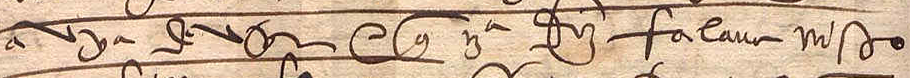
avya de vyr e q̄ ma dīz falaua nisto
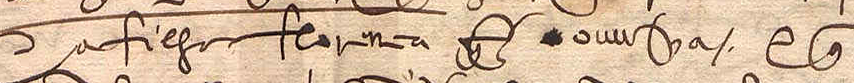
E a filha florença gz̄ ouuya /. E q̄
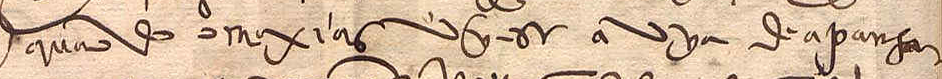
quãodo o mexias vyese avya de apanhar
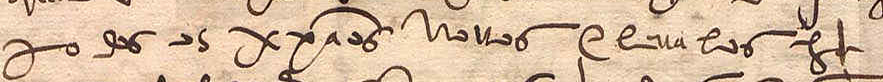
todos os Xpãos nouos e leualos ha
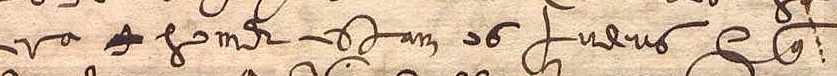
tera _ homde estam os Judeus e q̄
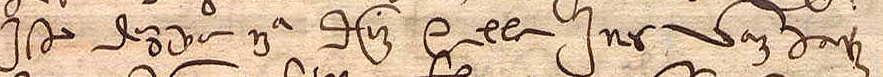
Jsto dezya ma dīz e ella Jnes Vāz tam
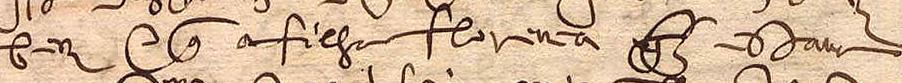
bem e q̄ a filha florença ḡz estaua
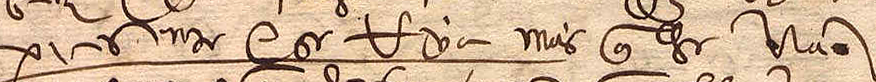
presente e se Rya mais q̄ lhe Naõ
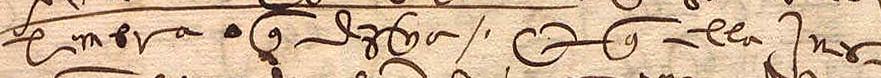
lembra o q̄ dezya /. E q̄ ella Jnes
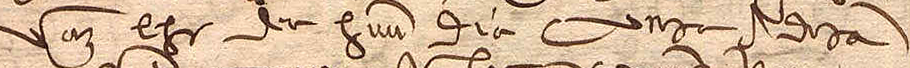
Vāz lhe deu hūu dia conta A dita
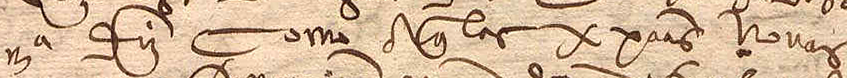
ma dīz Como Aq̄las xpaās nouas
